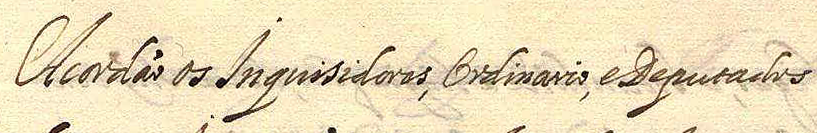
Acordaõ os Inquisidores, Ordinario, e Deputados
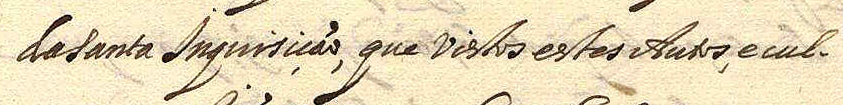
da santa Inquisiçaõ, que vistos estes Autos, e cul
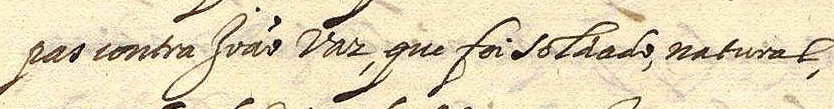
pas contra Joaõ Vaz, que foi soldado, natural,
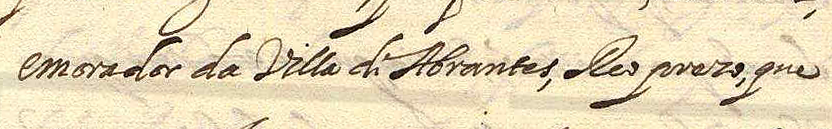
e morador da Villa de Abrantes, Reo prezo, que
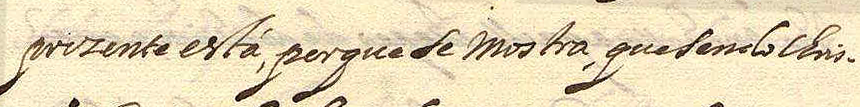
prezente está, porque se mostra, que sendo chris
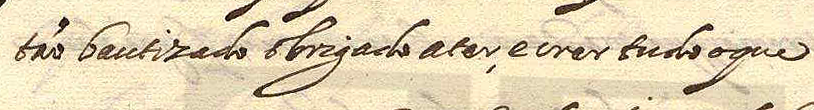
taõ bautizado obrigado a ter, e crer tudo o que
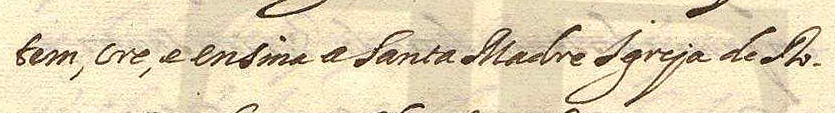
tem, cre, e ensina a Santa Madre Igreja de Ro
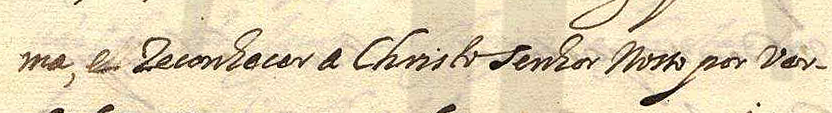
ma, e Reconhecer a Christo Senhor nosso por ver
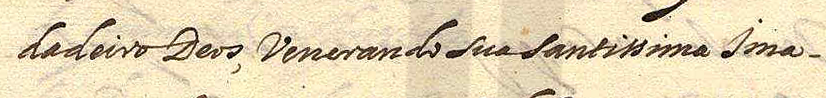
dadeiro Deos, venerando sua santissima Ima
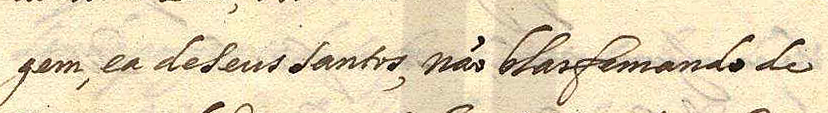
gem, e a de seus santos, não blasfemando de
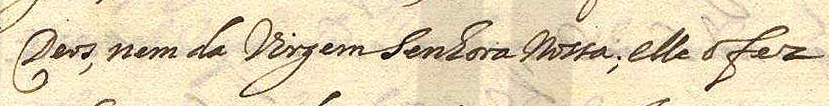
Deos, nem da Virgem Senhora nossa, elle o fez
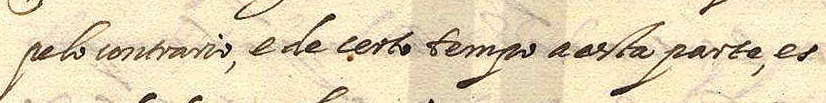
pelo contrario, e de certo tempo a esta parte, es
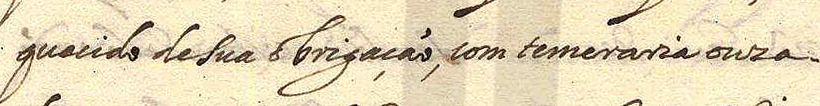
quecido de sua obrigaçaõ, com temeraria ouza
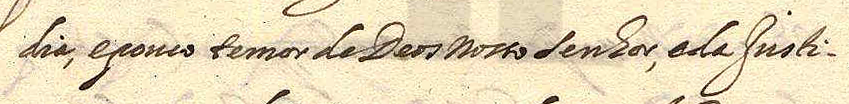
dia, e pouco temor de Deos nosso senhor, e da Justi
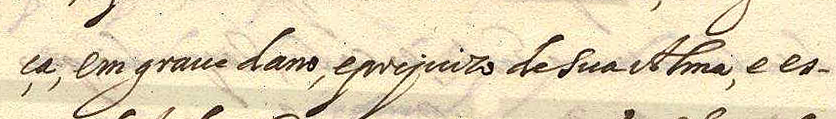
ça, em graue dano, e prejuizo de sua Alma, e es
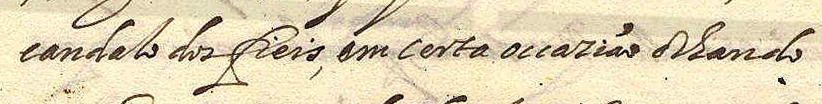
candalo dos fieis, em certa occaziaõ olhando
